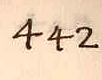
442
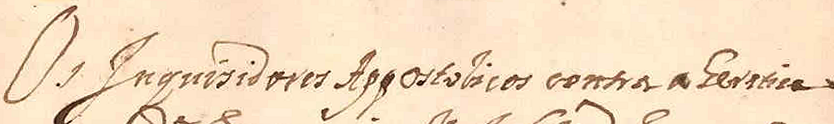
Os Jnquisidores Appostolicos contra a heretica
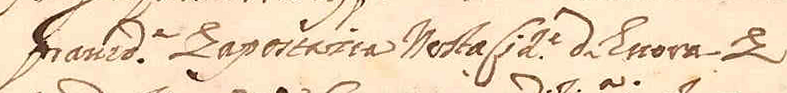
pravid.e E apostazia Nesta Cid.e de Euora E
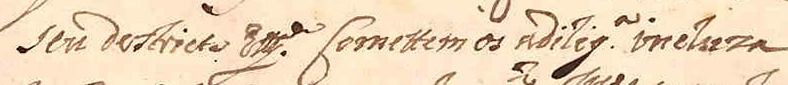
seu destricto, Ettꝭ.a Comettemos a dilig.a incluza
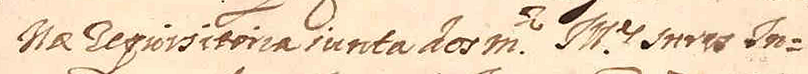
na Requisitoria iunta dos m.to Ill.es snres In
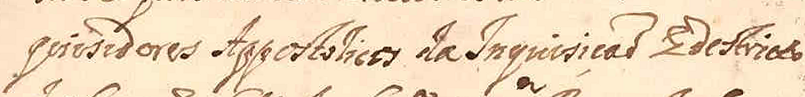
quisidores Appostolicos da Inquisiçaõ E destricto
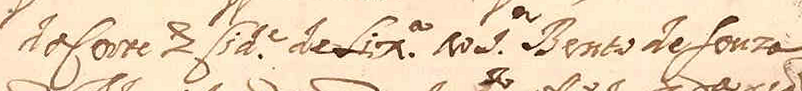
da Corte, E Cid.e de Lix.a ao S.or Bento de Souza
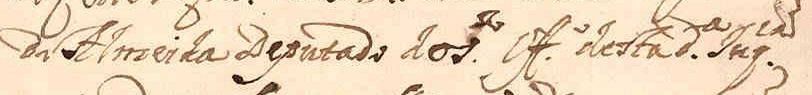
de Almeida Deputado do s.to Off.o desta d.a Inq.ção
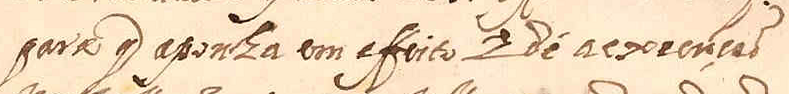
para q̄ a ponha em effeito E dé a execuçaõ
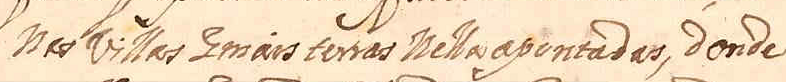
nas villas E mais terras nella apontadas, donde
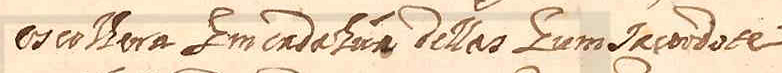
escolhera Em cada huā dellas hum sacerdote
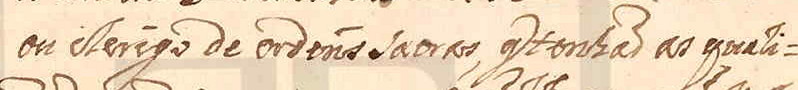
ou clerigo de ordens sacras, q̄ tenhaõ as quali
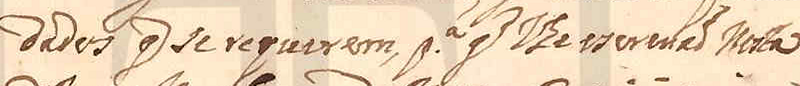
dades q̄ se requerem, p.a q̄ lhe escreuaõ nesta
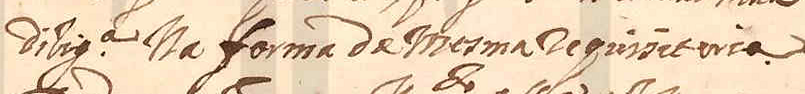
dilig.a na forma da mesma Requisitoria
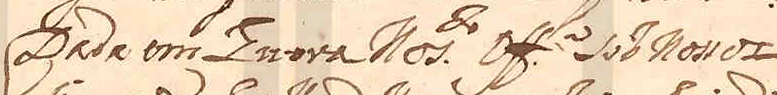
Dada em Euora no s.to Off.o sob nossos
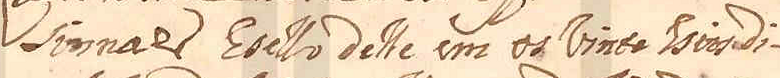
sinnaes E sello delle em os vinte E seis di
